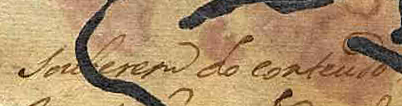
souberem do conteudo
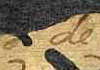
o de
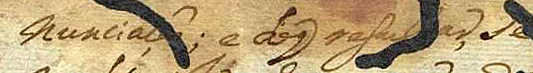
nunciaçaõ; e do q̄ resul_ar, se
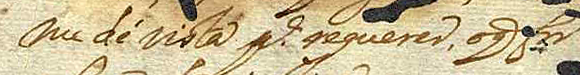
me dé vista p.a requerer, o q̄ for
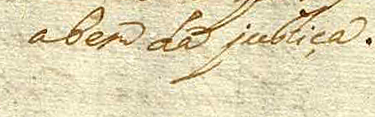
a bem da justiça.
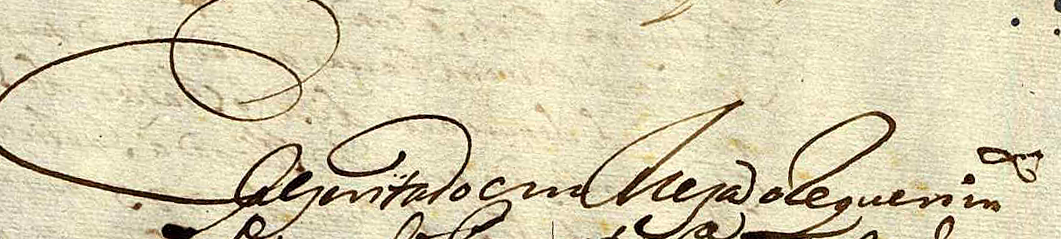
E prezentado em Meza o Requerimto
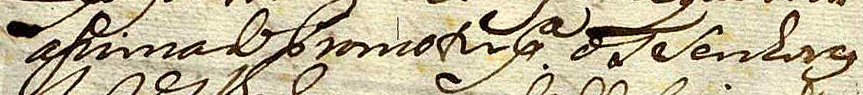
assima do Promotor p.a os Senhores
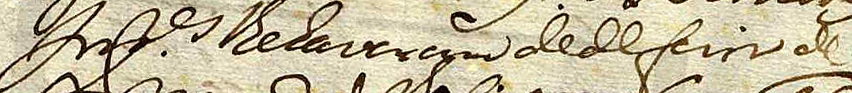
Jnq.res lhe haverem de deferir de
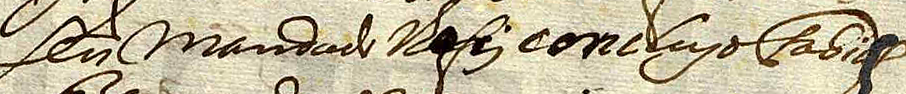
seu mandado lho fis concluzo Fabiaõ
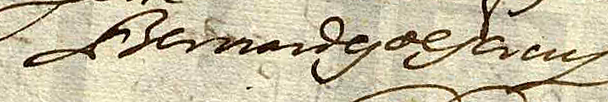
Bernardes o escreuj
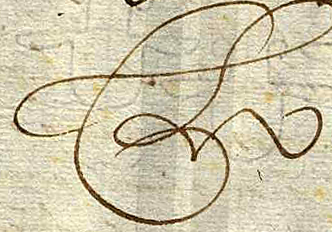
CLo
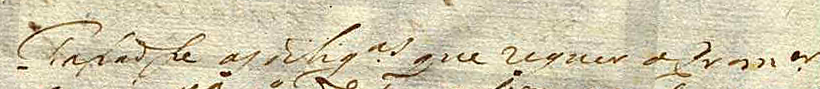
Fassaõ sse as dilig.as que requer o Prom.or
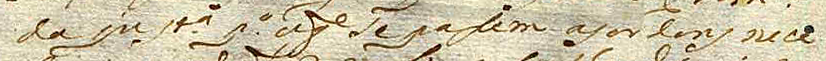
da just.a p.a o q̄ se passem as ordens nece
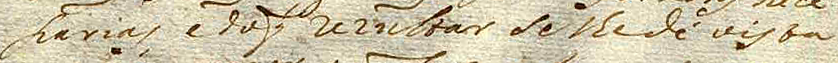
ssarias, e do q̄ rezultar se lhe dé vista
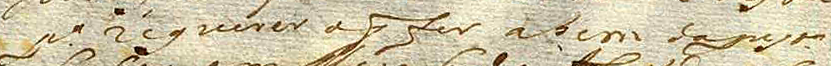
pa. requerer o q̄ for a bem da just.a
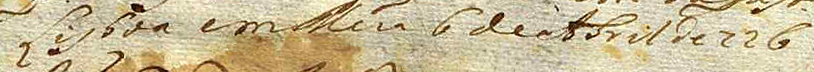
Lisboa em Meza 6 de Abril de 726
